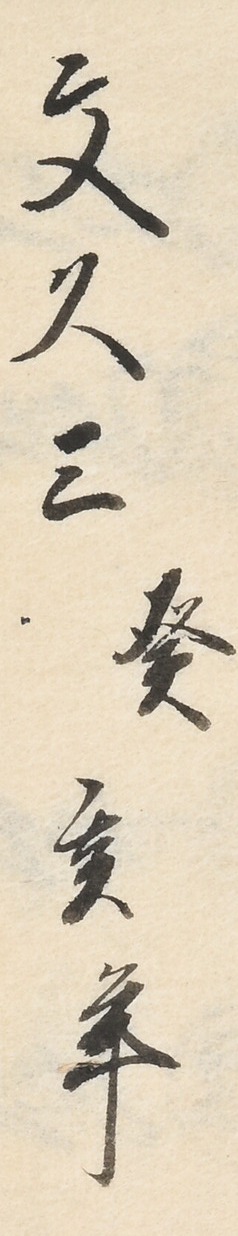文久三癸亥年
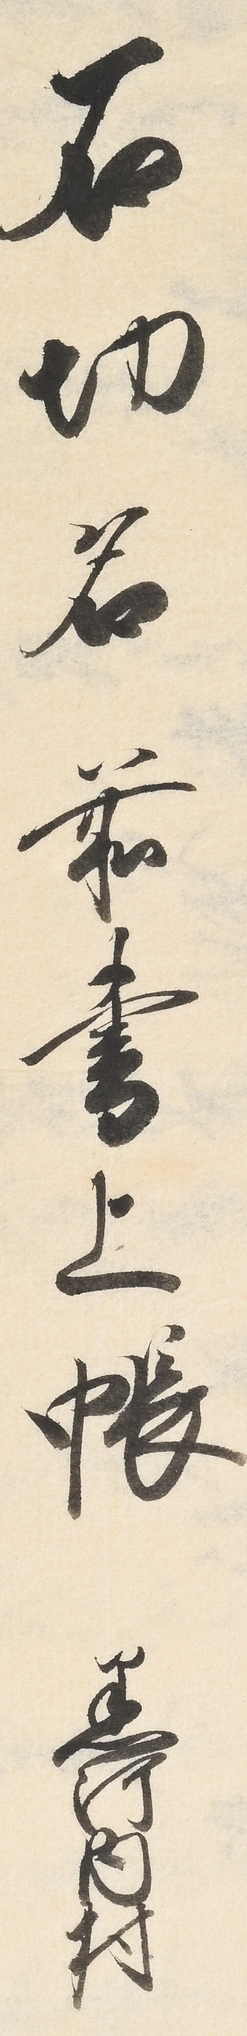石切名前書上帳黒河内村

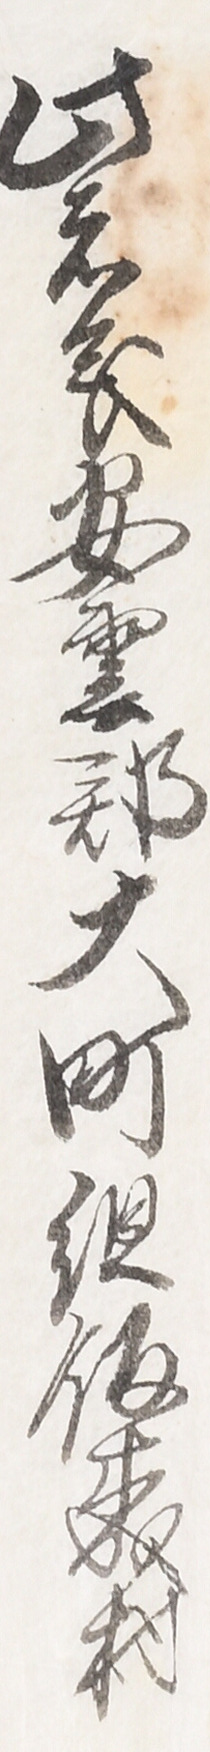此者義安曇郡大町組飯森村
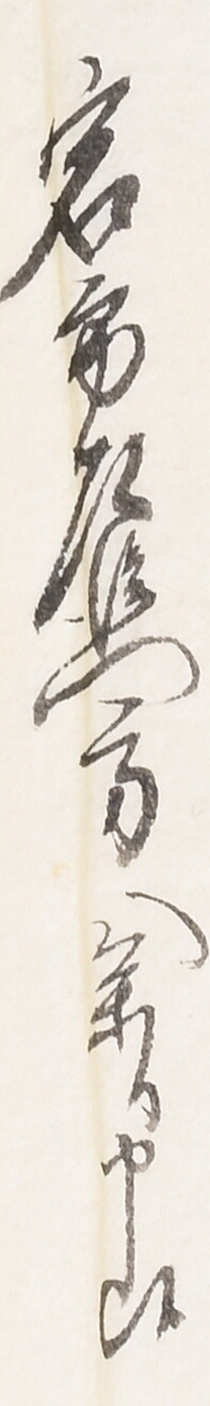宿市左衛門方へ参り申候
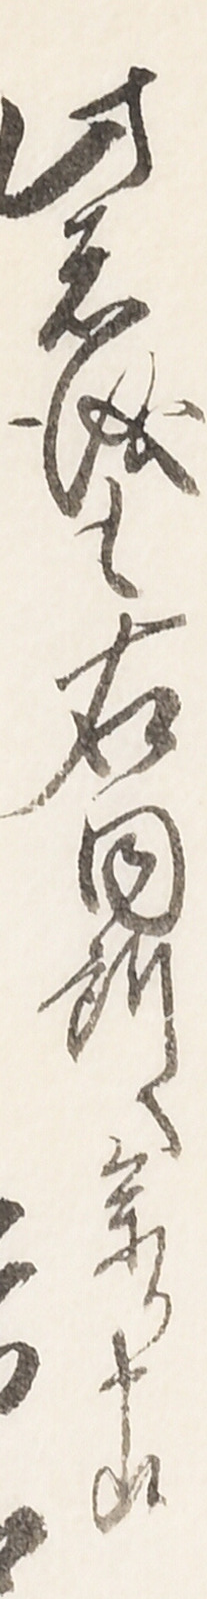此者儀者右同断へ参り申候
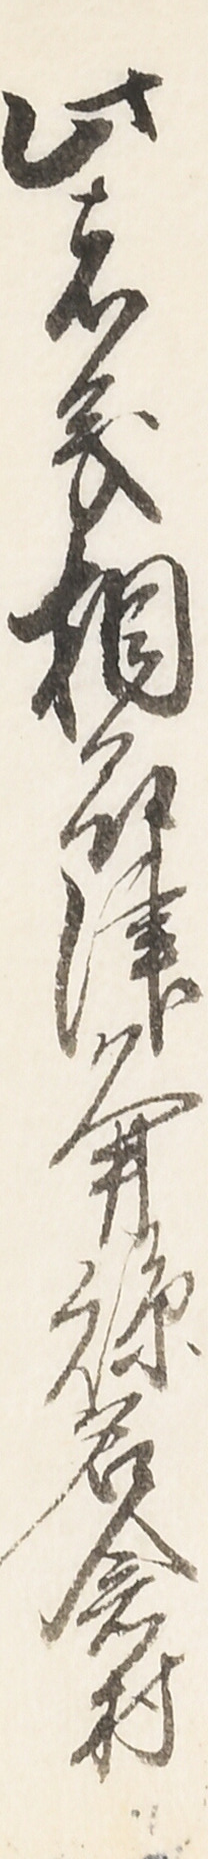此者義相州津久井県名倉村
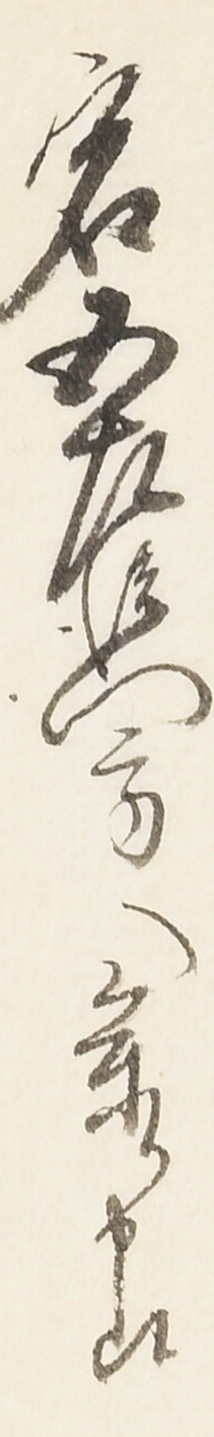宿五左衛門方へ参り申候
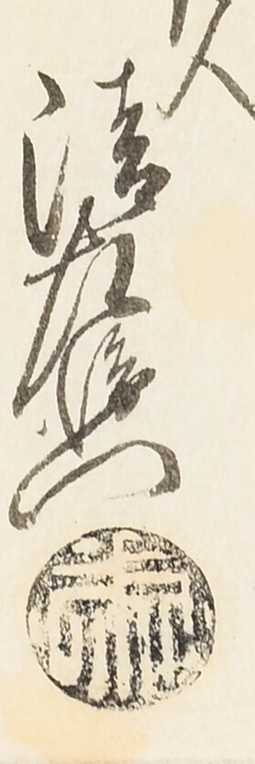清左衛門(印)
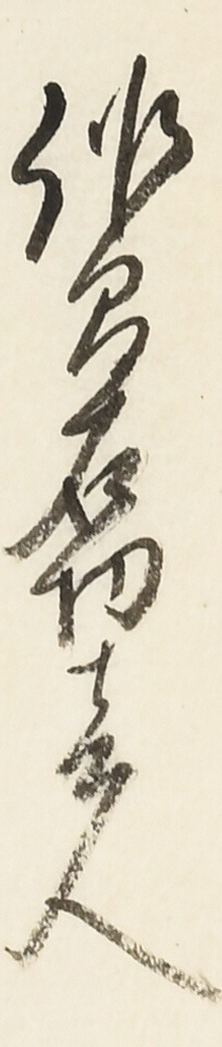作間石切壱人

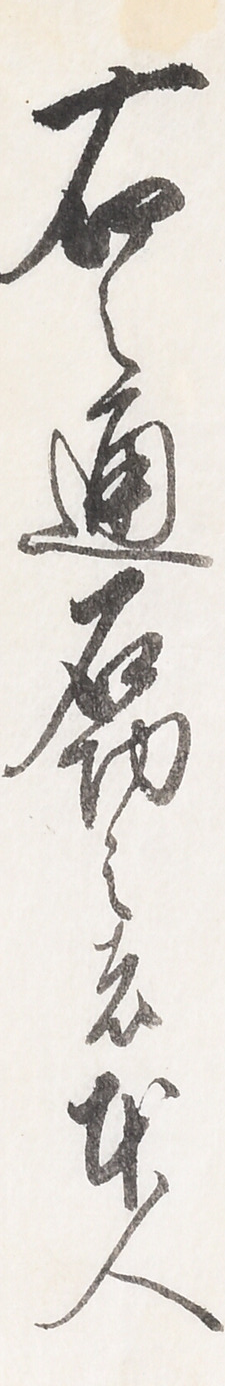右之通石切之者本人
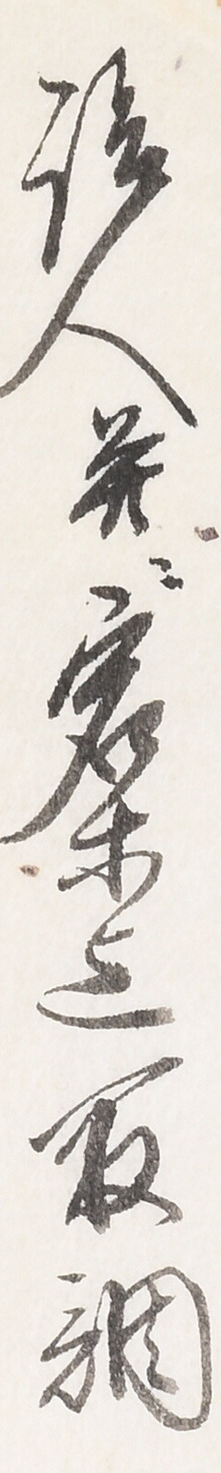請人并ニ宿等迄取調
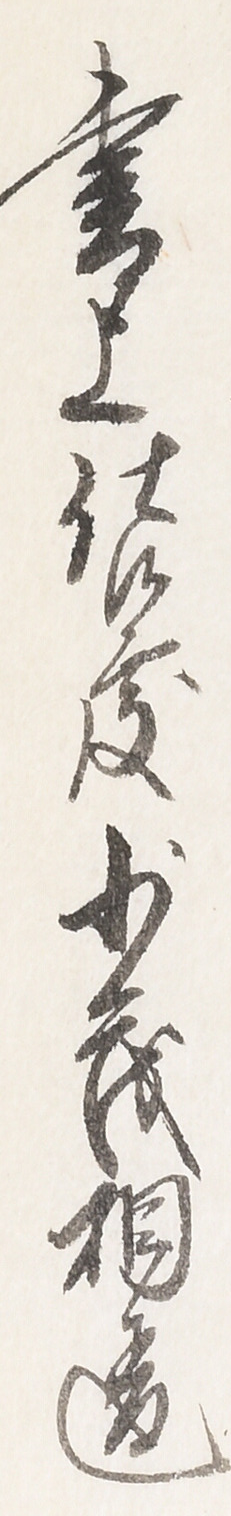書上仕候処少茂相違
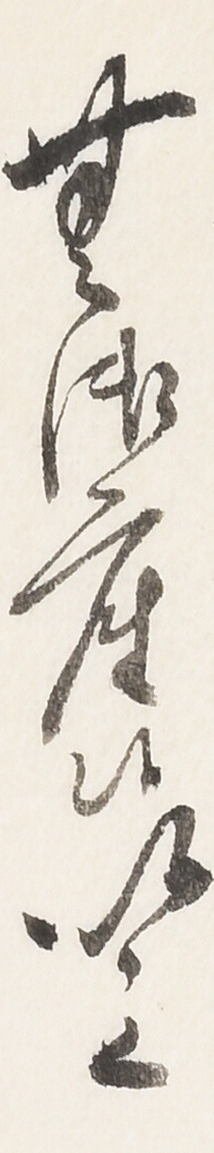無御座候以上
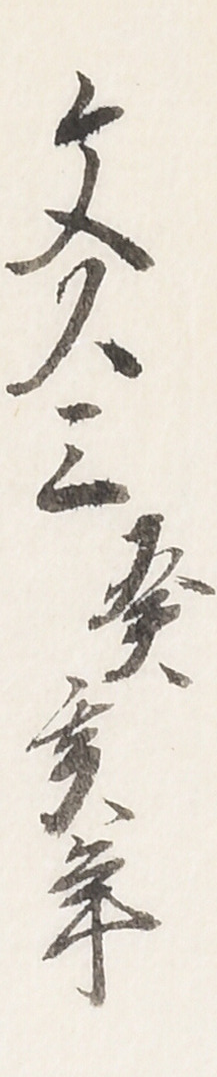文久三癸亥年
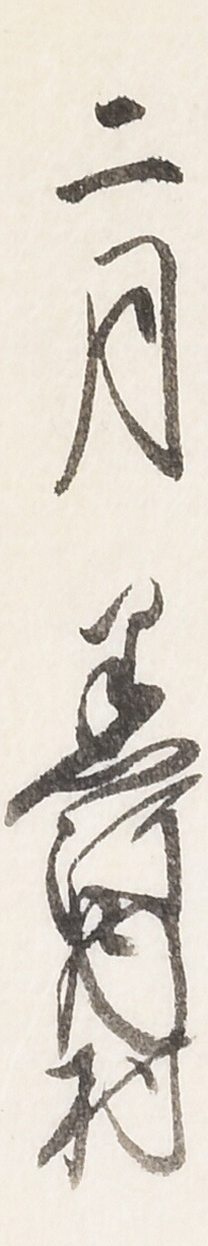二月黒河内村
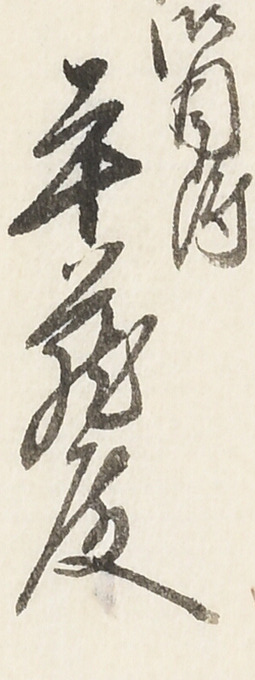平蔵殿
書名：文久三癸亥年石切名前書上帳
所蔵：伊那市立高遠町図書館・合同会社AMANE
